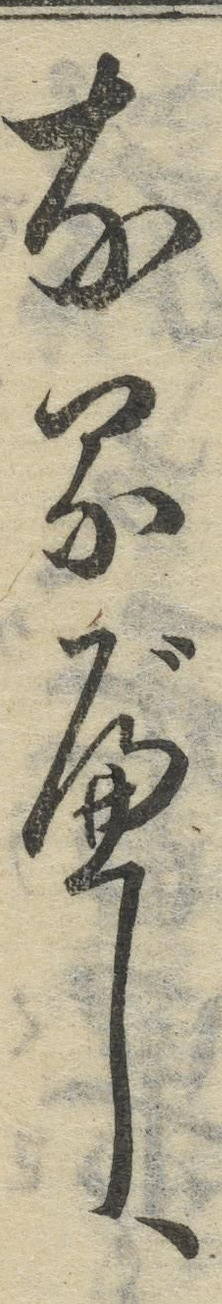なるべし、
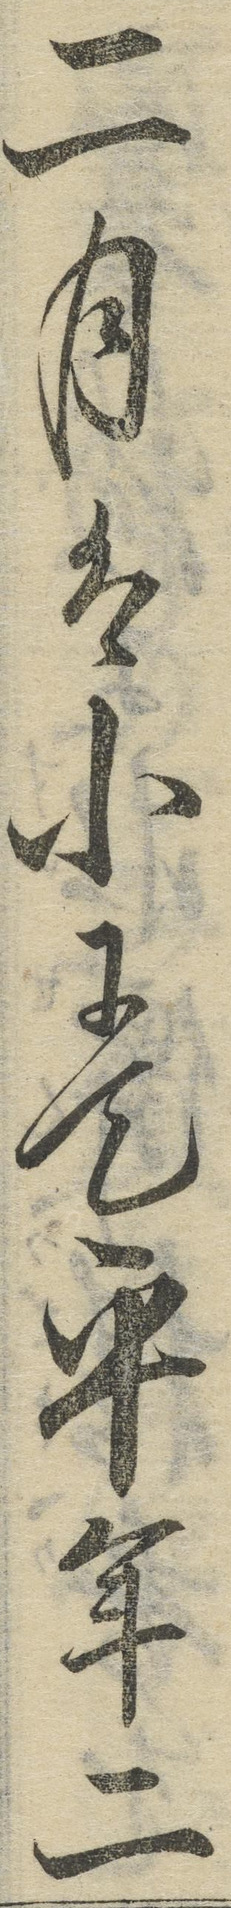二月は小にて平年二
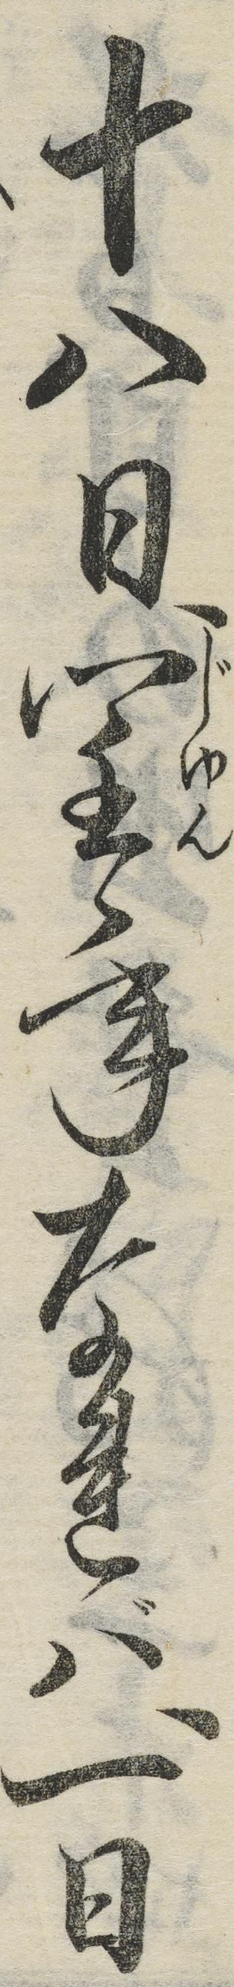十八日、閏年なれば、一日
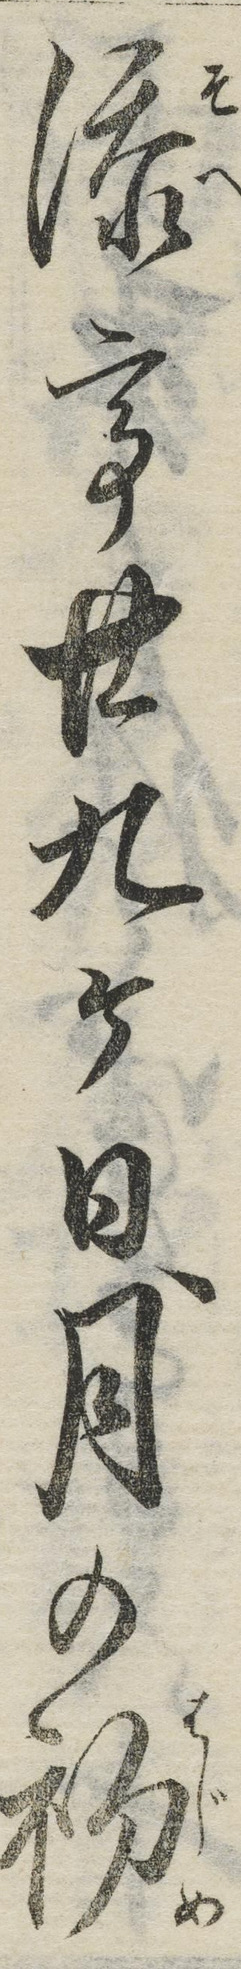添て廿九ヶ日、月の初
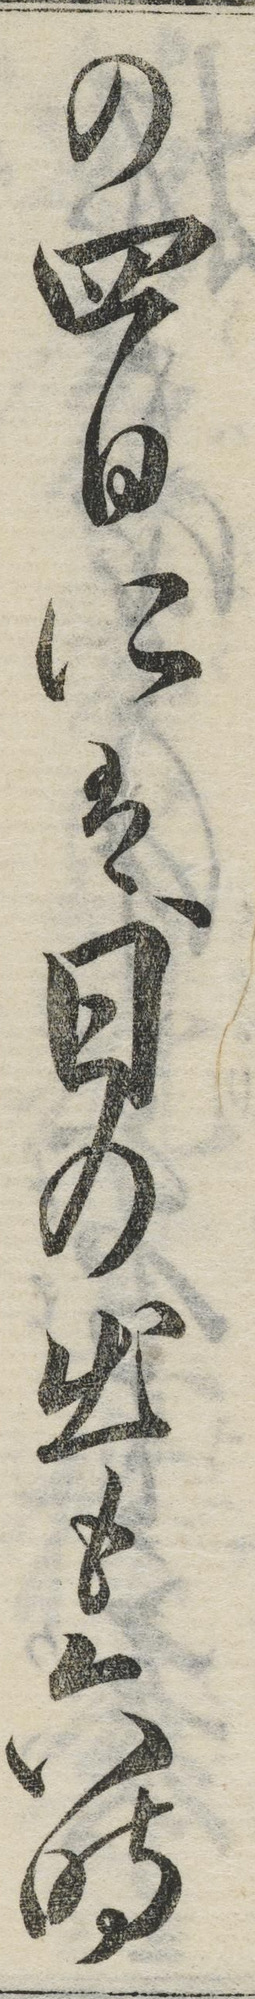の四日には、日の出も六時
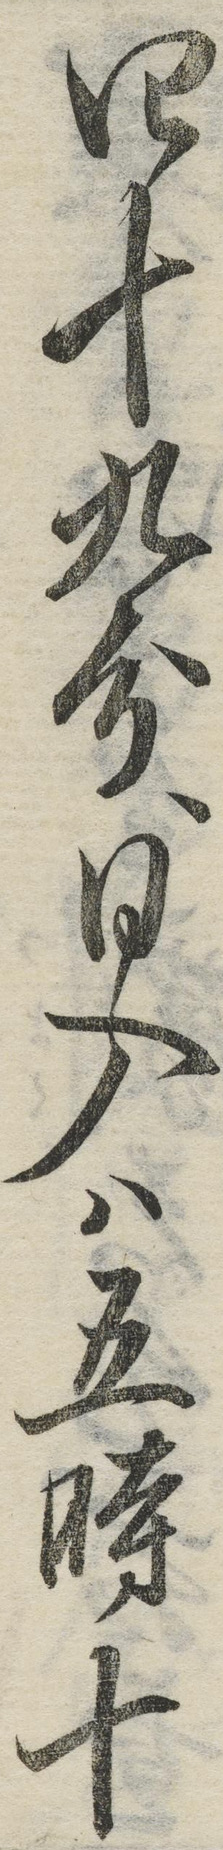四十九分、日入は五時十
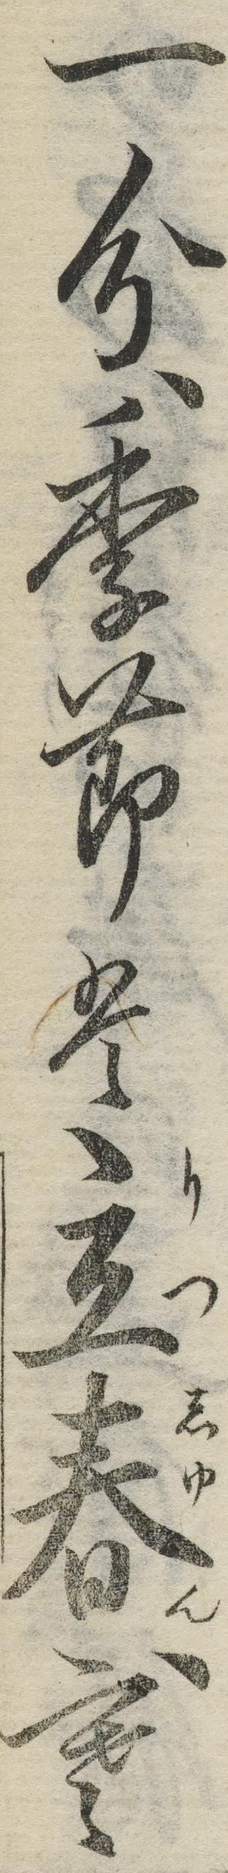一分、季節は立春、寒

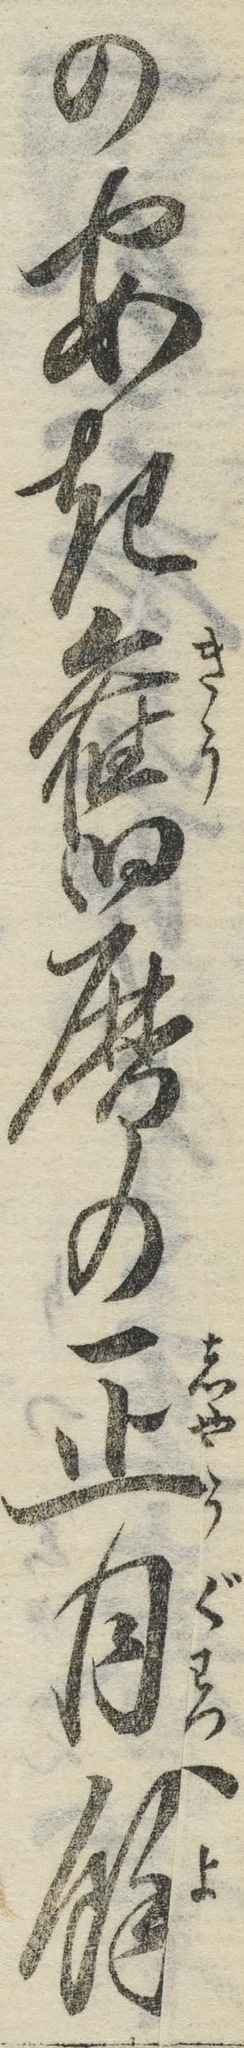のあき旧暦の正月、余
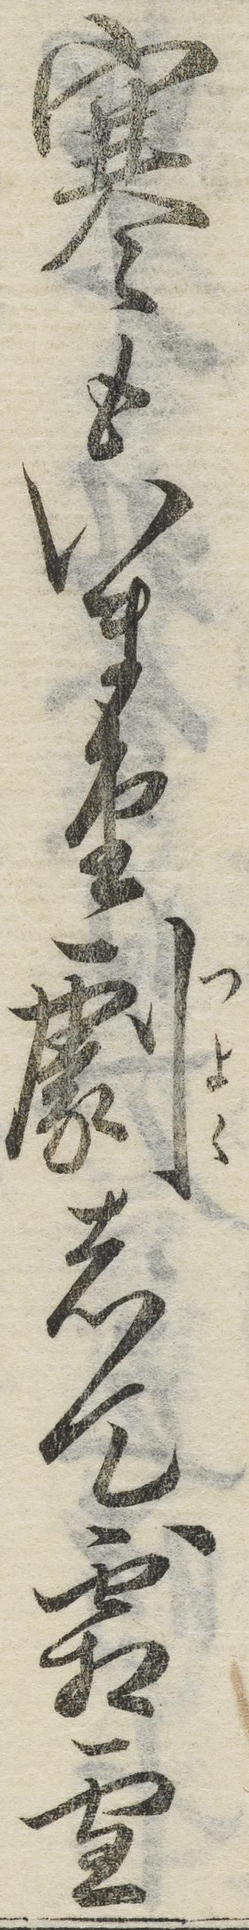寒もいまた劇して、霜雪
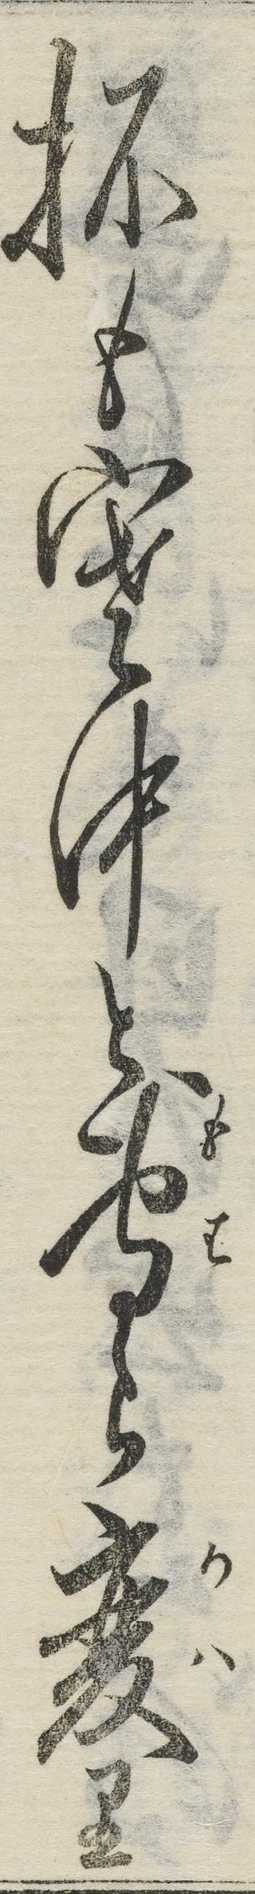抔も寒中と、専ら変り
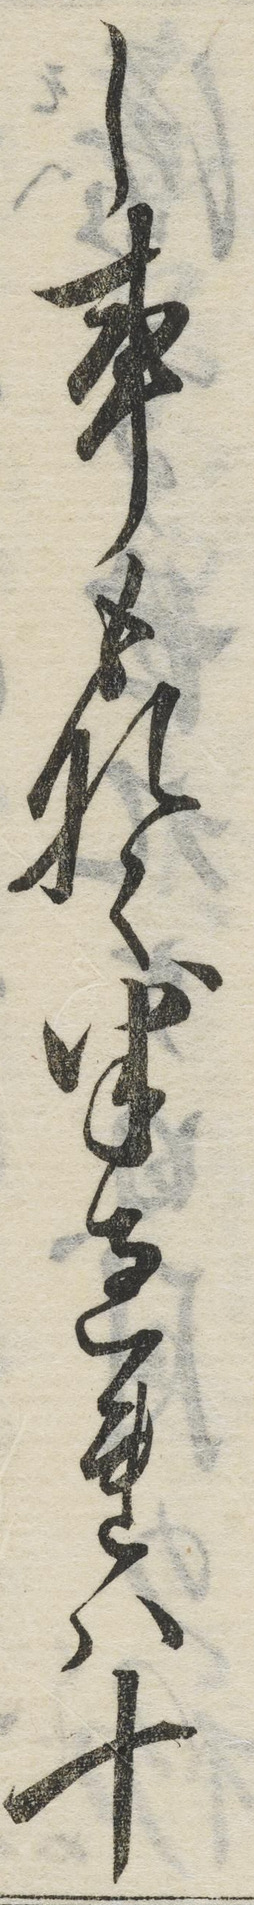し事もなく、半過れば十
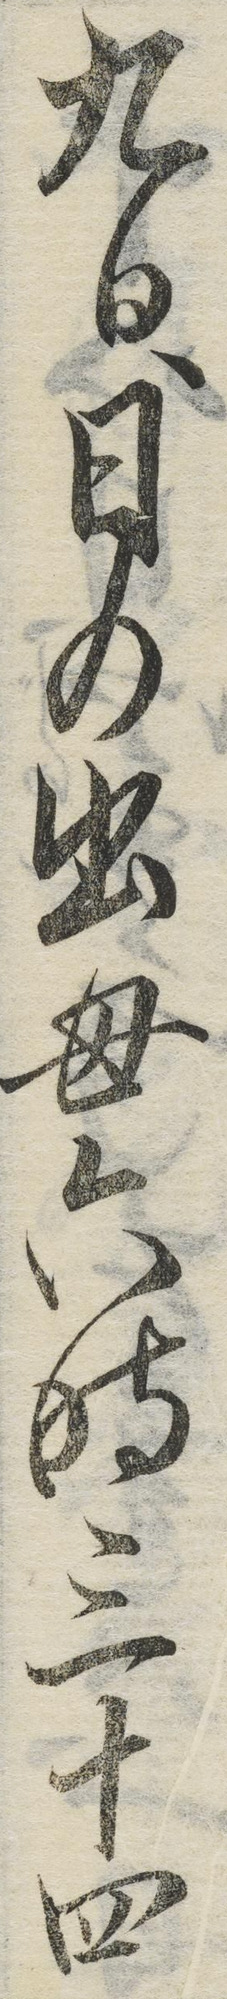九日、日の出も六時三十四
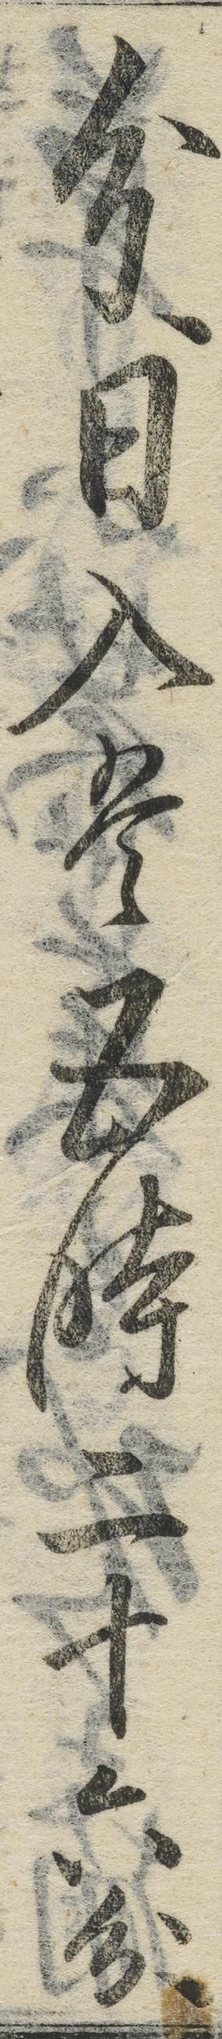分、日入は五時二十六分、
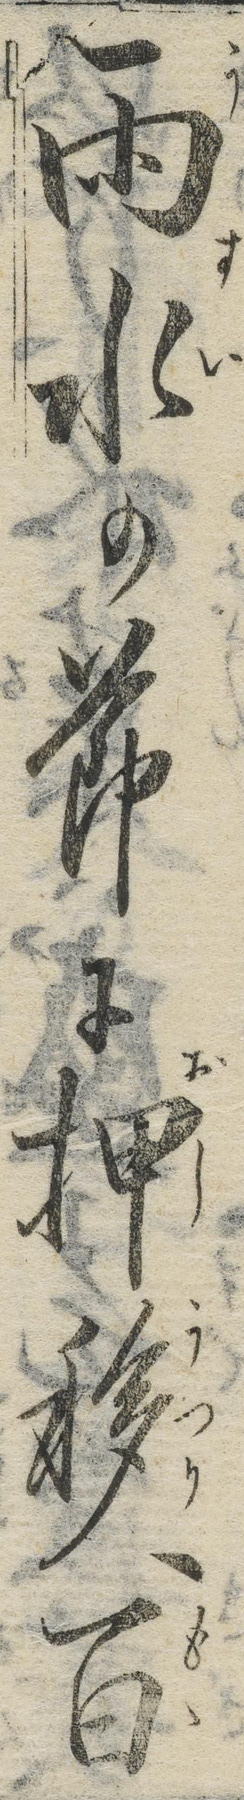雨水の節に押移、百
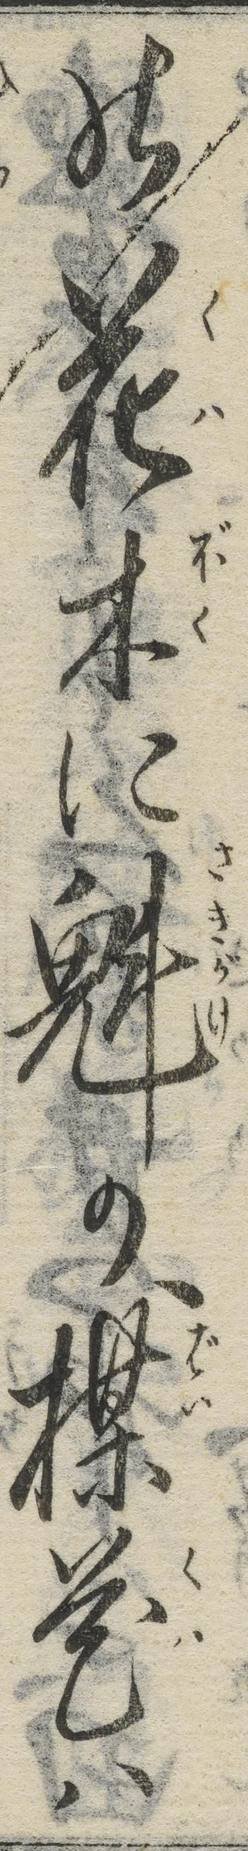の花木に魁の、楳花は
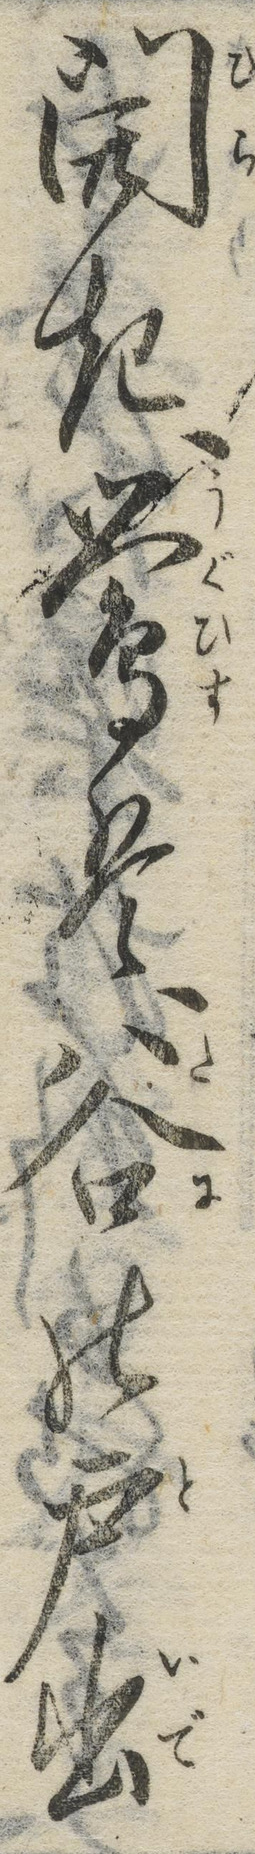開き、鶯は、谷の戸出
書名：暦日往来　單
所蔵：東京大学地震研究所図書室 Earthquake Research Institute Library, The University of Tokyo, JAPAN
